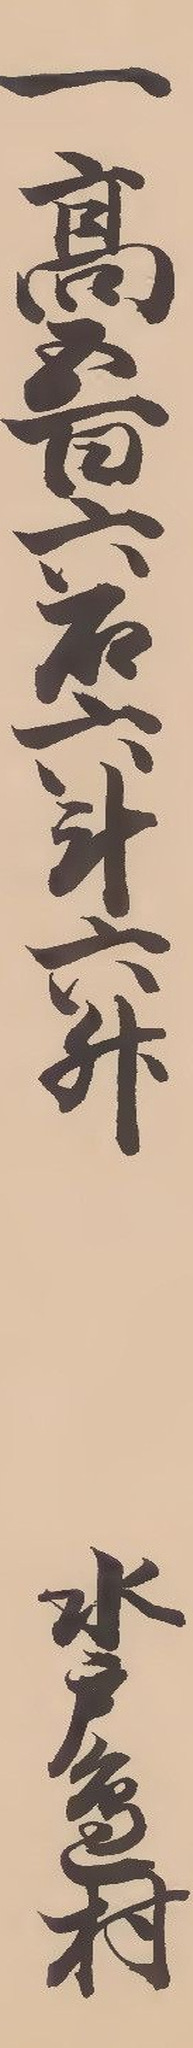一高五百六石六斗六升水戸辺村
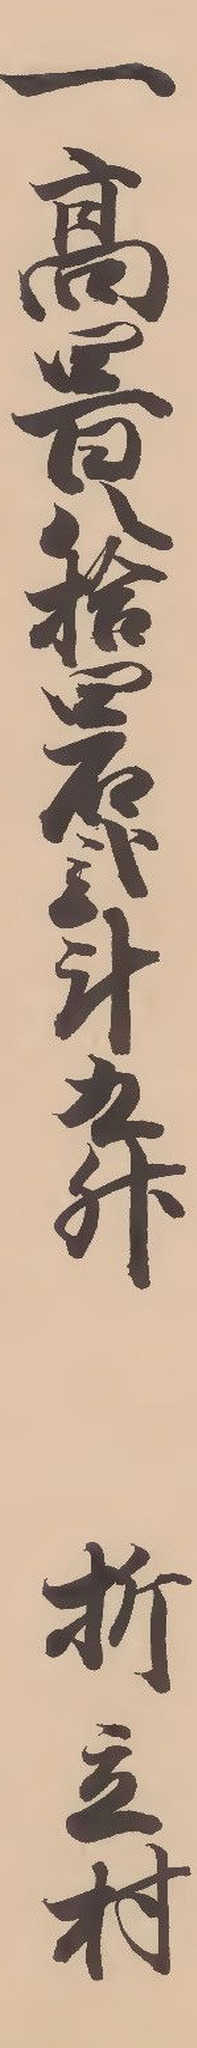一高四百八拾四石弐斗九升折立村
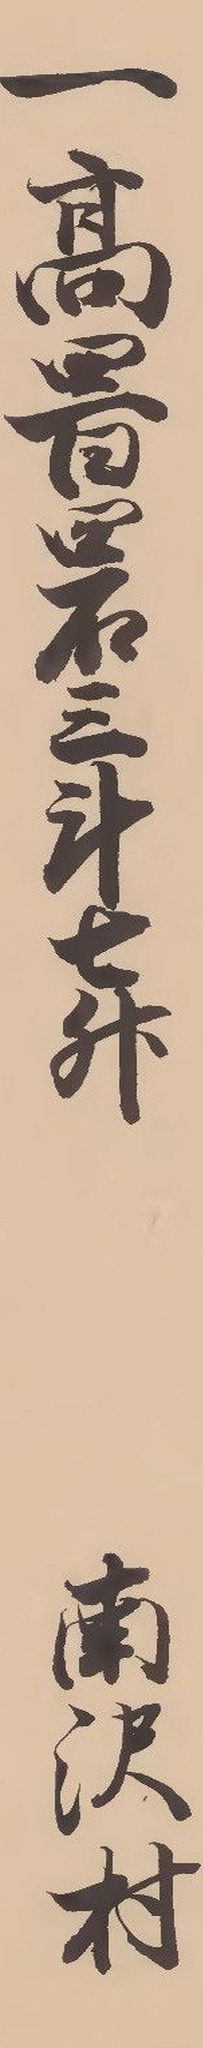一高四百四石三斗七升南沢村
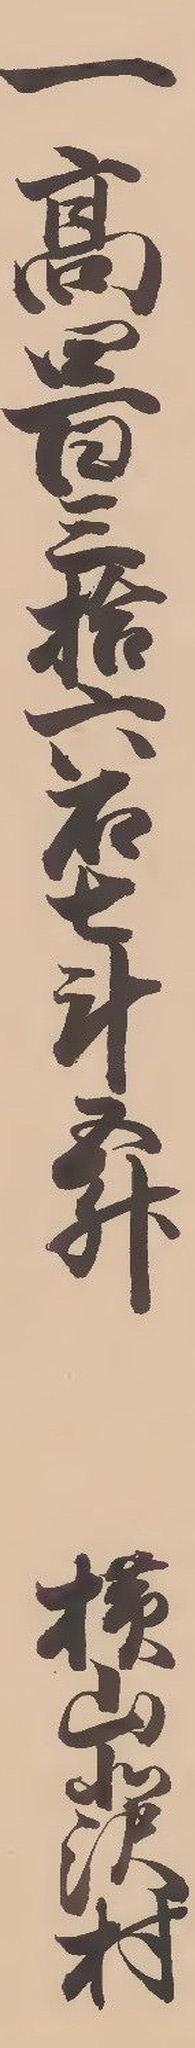一高四百三拾六石七斗五升横山北沢村

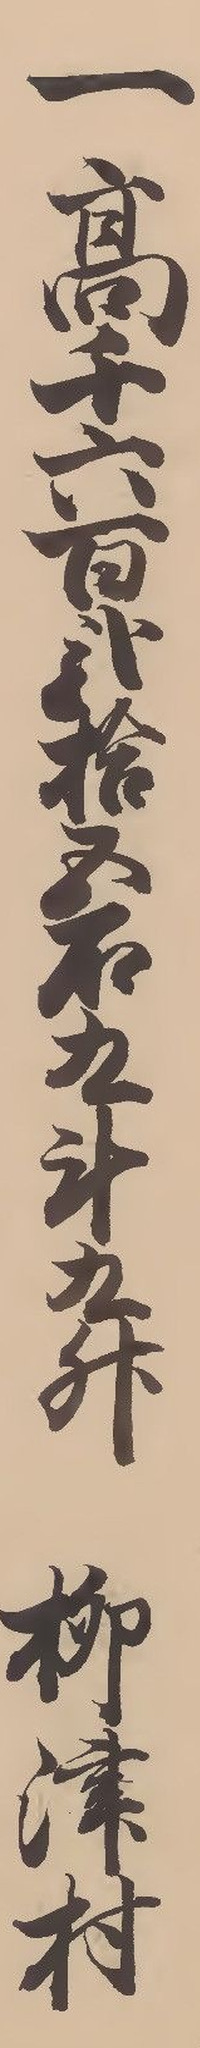一高千六百弐拾五石九斗九升柳津村
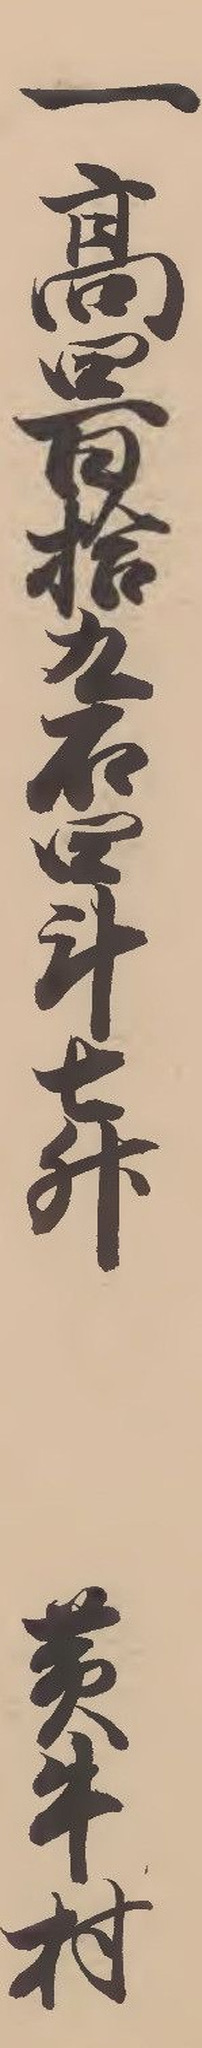一高四百拾九石四斗七升黄牛村
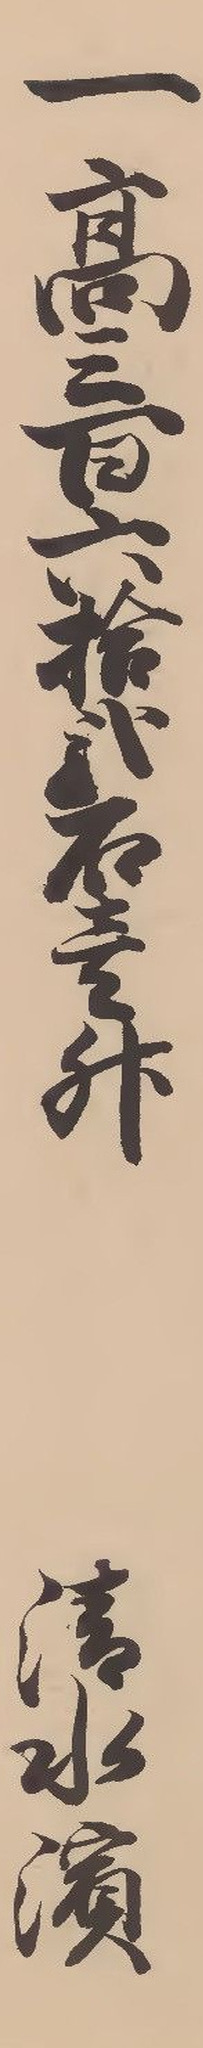一高三百六拾弐石壱升清水浜
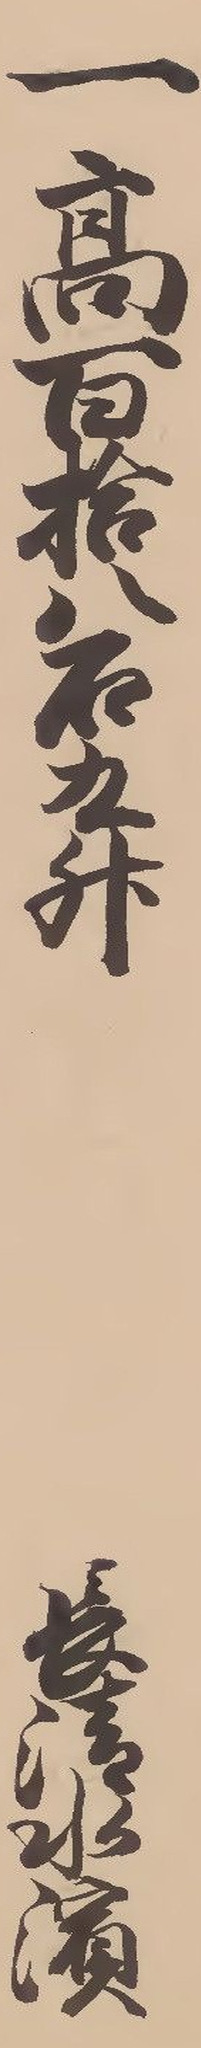一高百拾八石九升長清水浜
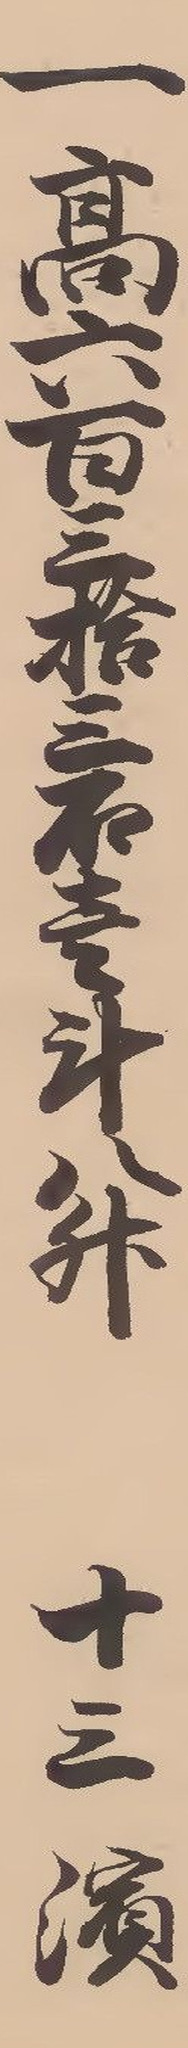一高六百三拾三石壱斗八升十三浜
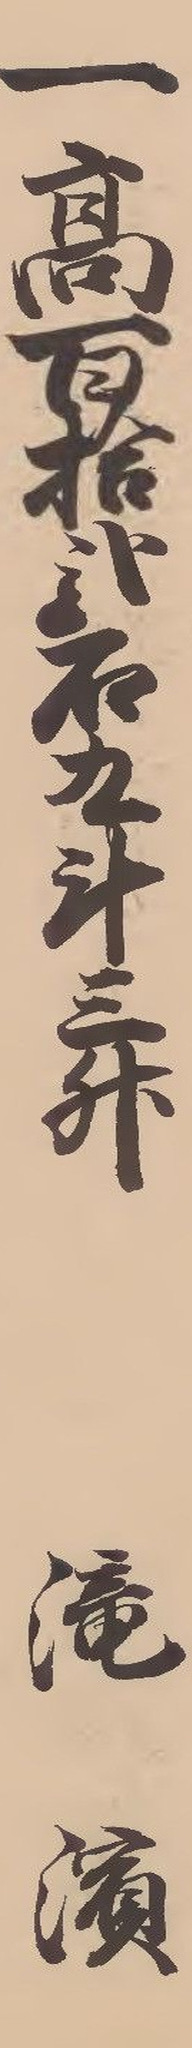一高百拾弐石九斗三升滝浜
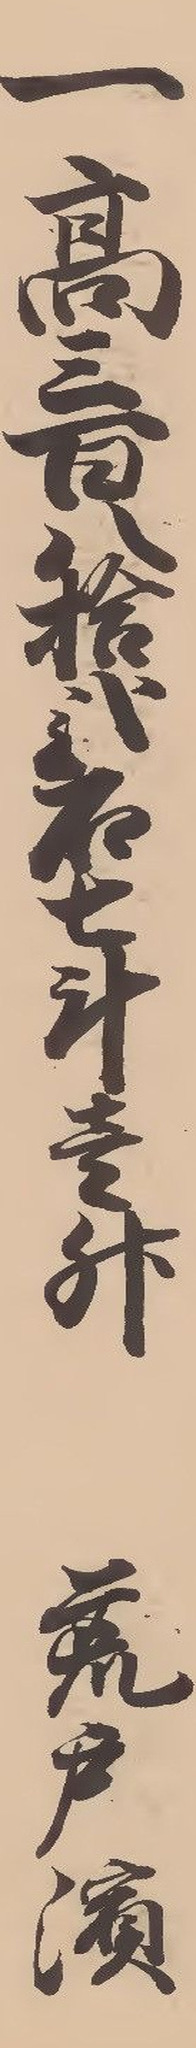一高三百八弐石七斗壱升荒戸浜
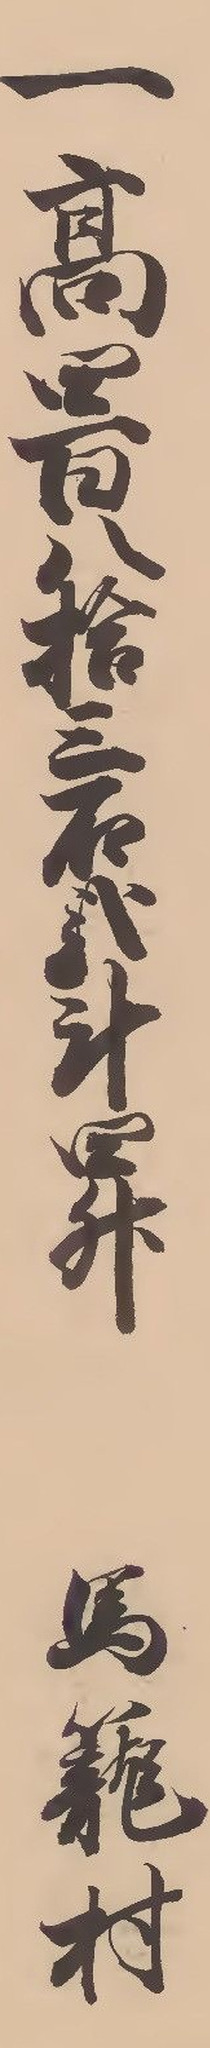一高四百八拾三石弐斗四升馬篭村

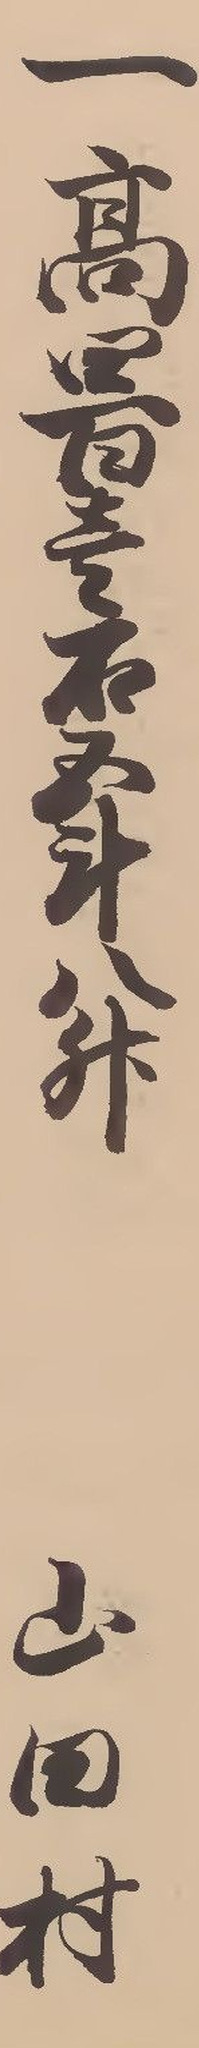一高四百壱石五斗八升山田村
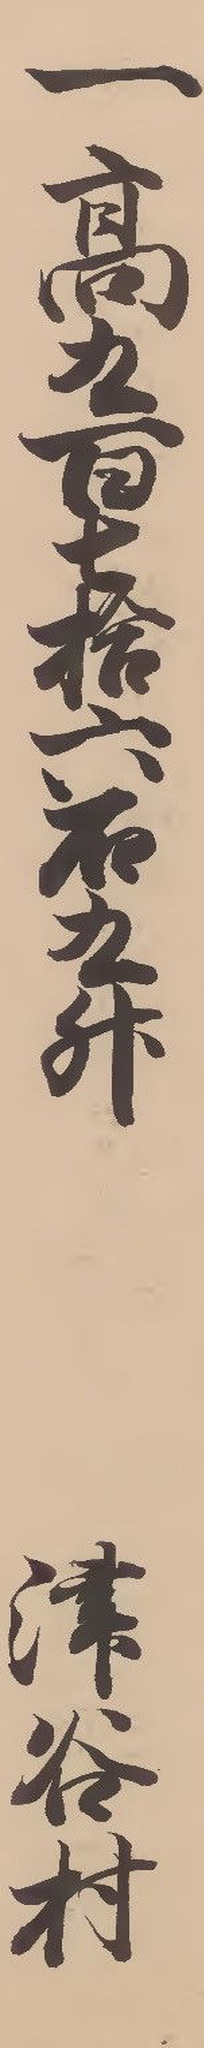一高九百七拾六石九升津谷村
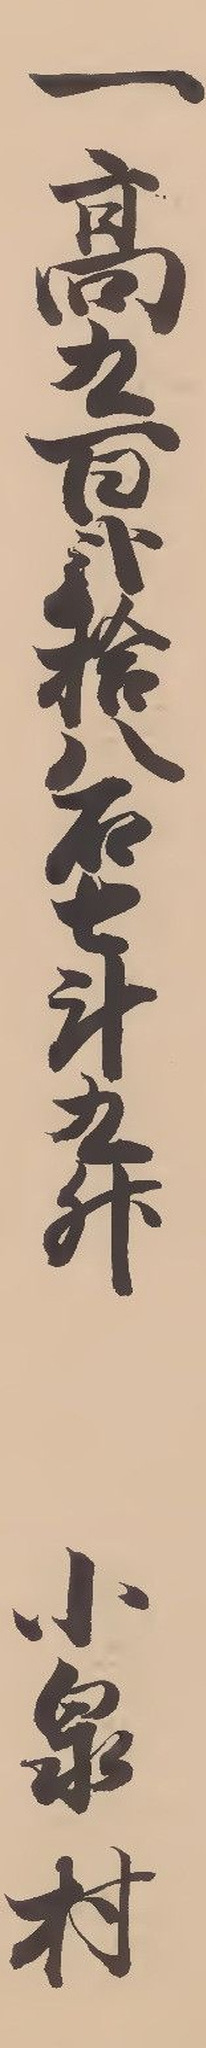一高九百弐拾八石七斗九升小泉村
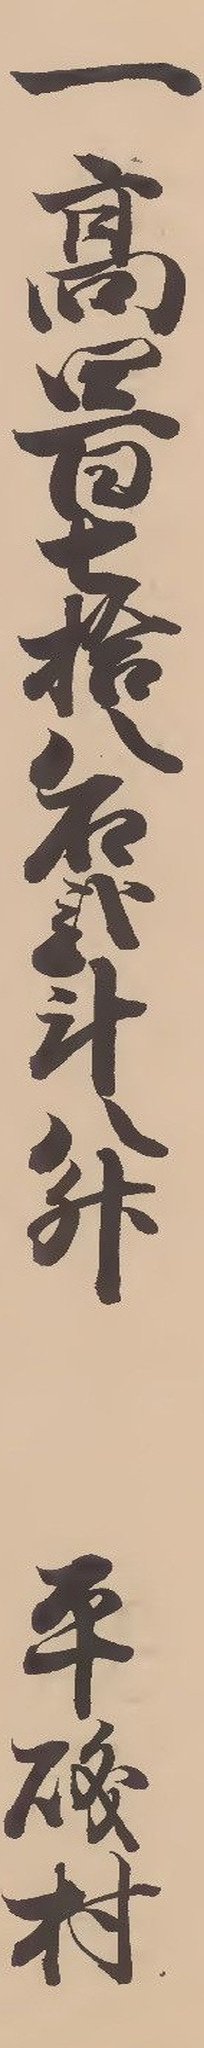一高四百七拾八石弐斗八升平磯村
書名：陸奥国郷帳　５
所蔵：国立公文書館 National Archives of Japan
